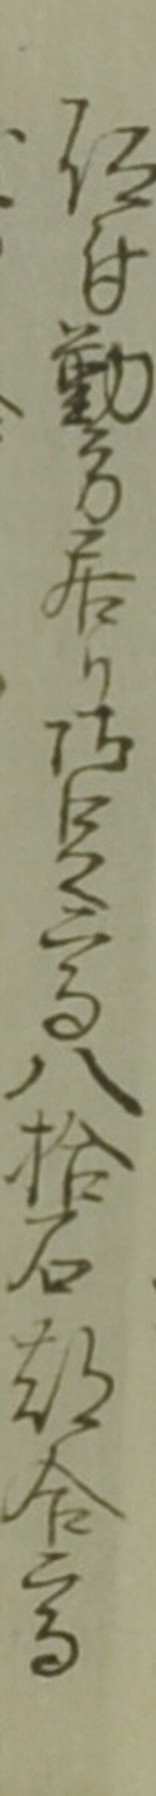仰付勤方居り御足高八拾石都合高
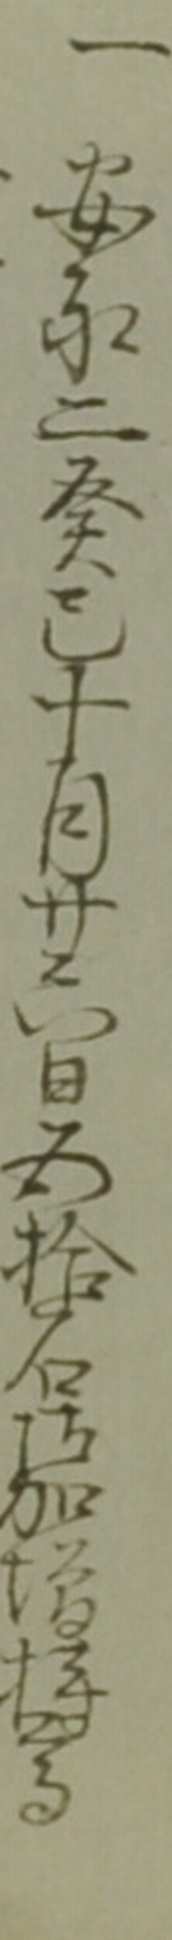一安永二癸巳十月廿六日五拾石御加増持高
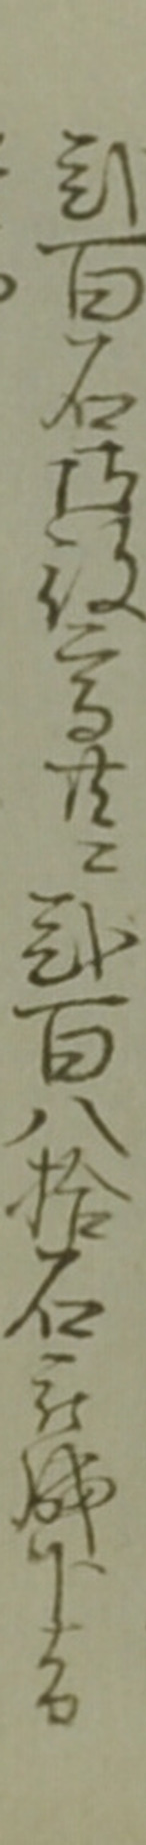弐百石役高共ニ弐百八拾石被成下旨
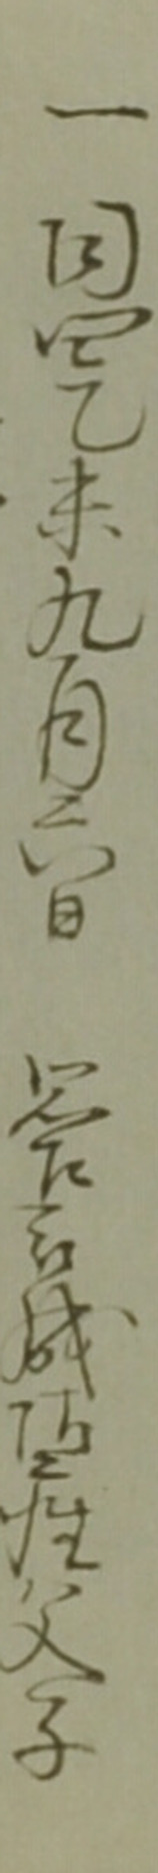一同四乙未九月六日思召被成御座父子
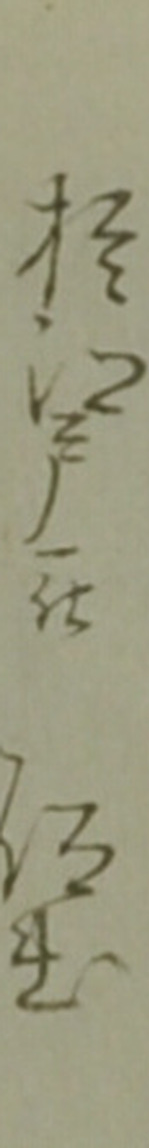於江戸被仰出
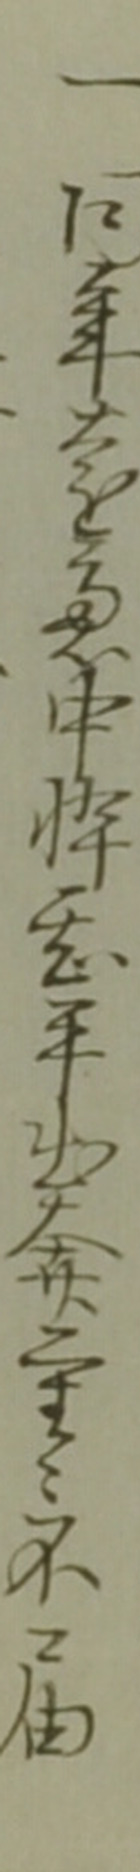一同年遠慮中倅甚平出奔重々不届
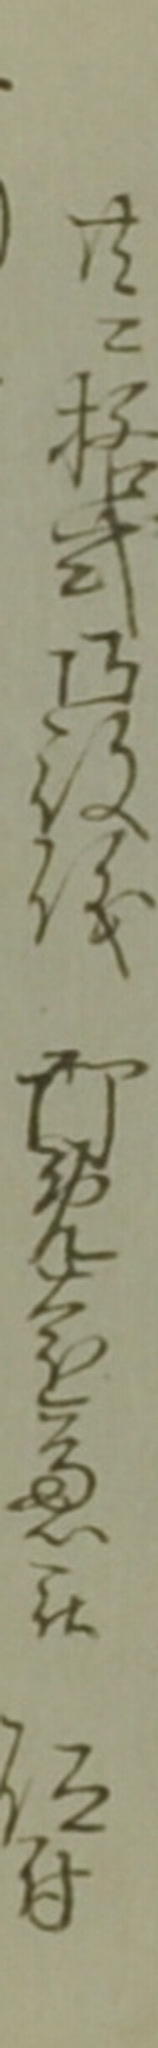共ニ格式御役儀御免遠慮被仰付
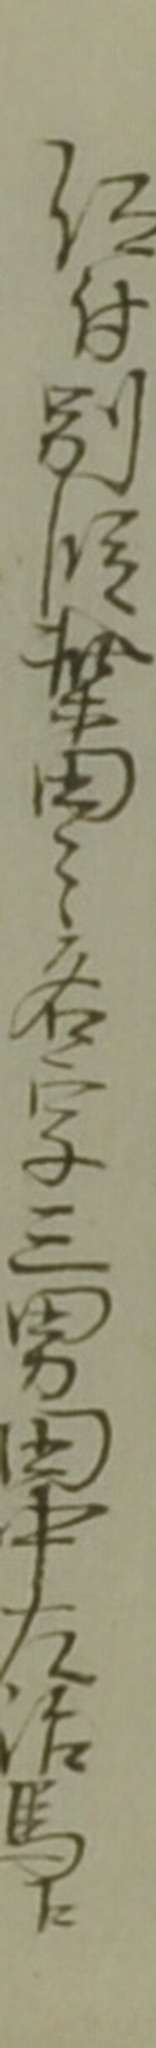仰付別段柴田之名字三男田中左治馬江
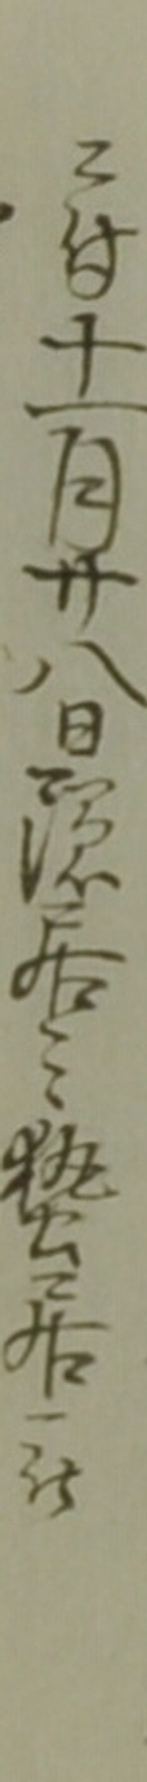二付十一月廿八日隠居之蟄居被
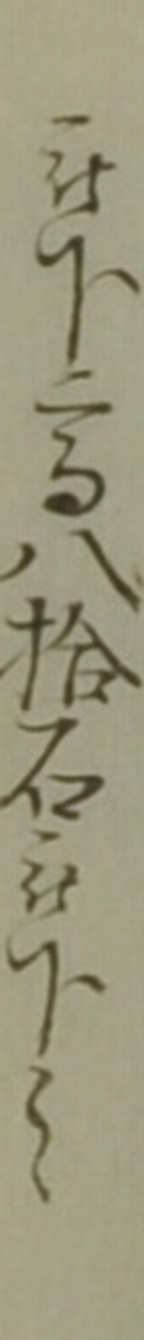被下高八拾石被下候
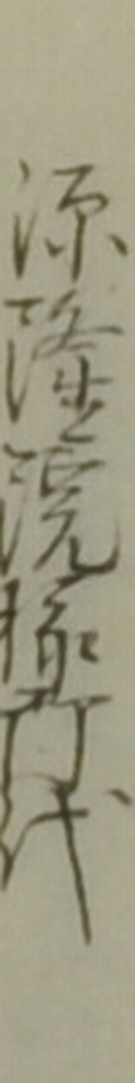源隆院様御代
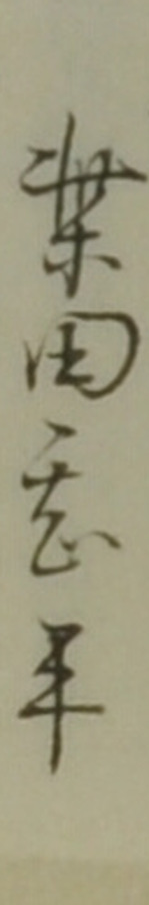柴田甚平
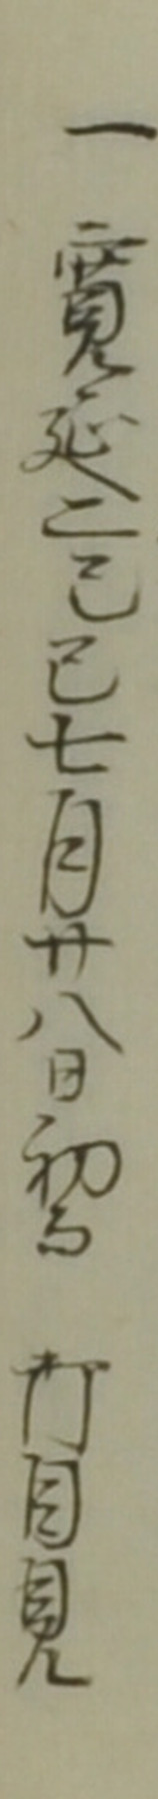一寛延二乙巳七月廿八日初而御目御
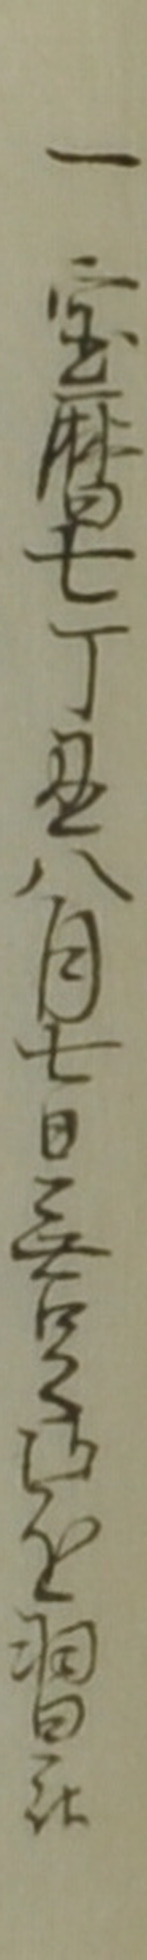一宝暦七丁丑八月七日無足御近習被
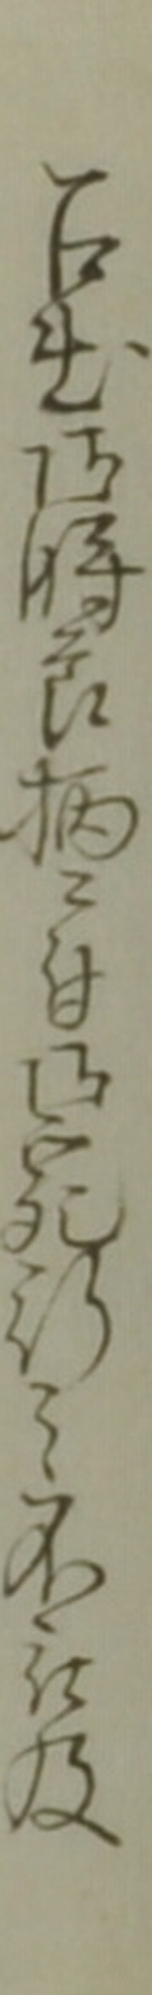召出御時節柄二付御宛行之不被及
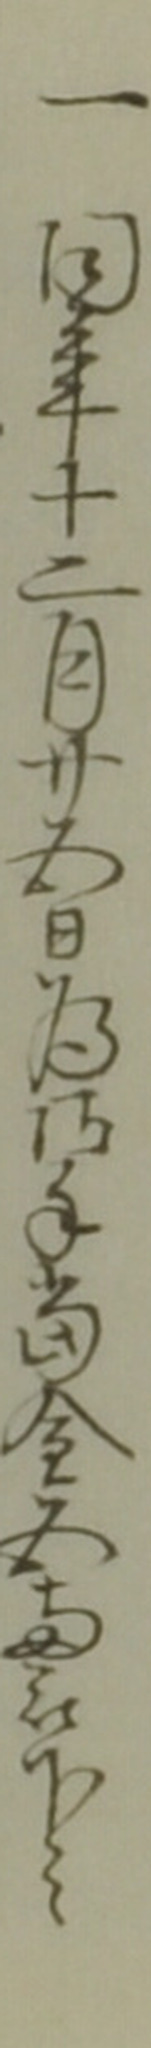一同年十二月廿五日為御手当金五両被下候
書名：給人諸士勤仕録（三）
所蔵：伊那市立高遠町図書館・合同会社AMANE
